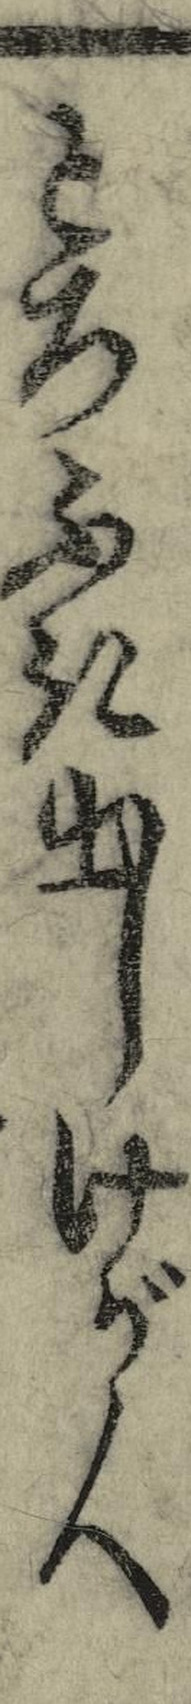とろふき出しけが人
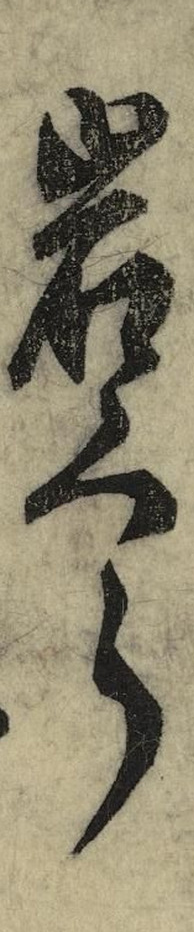岩くら
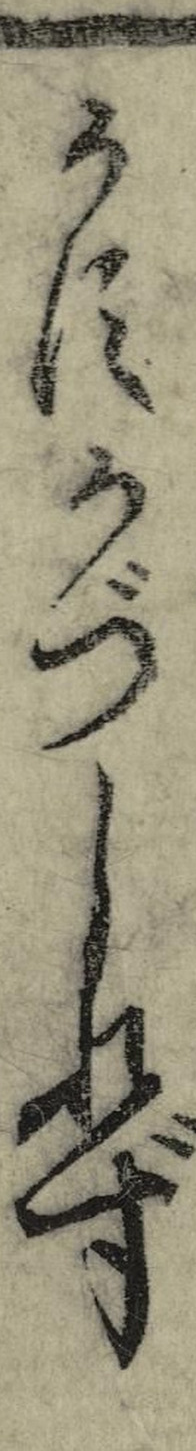かすかづしれず
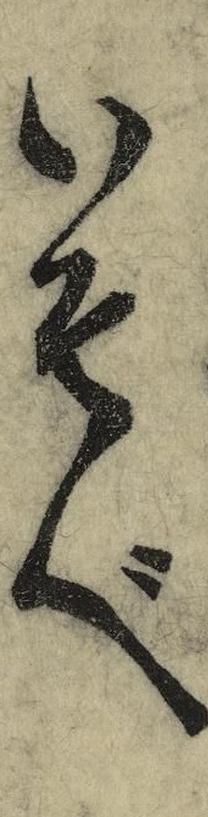いそべ
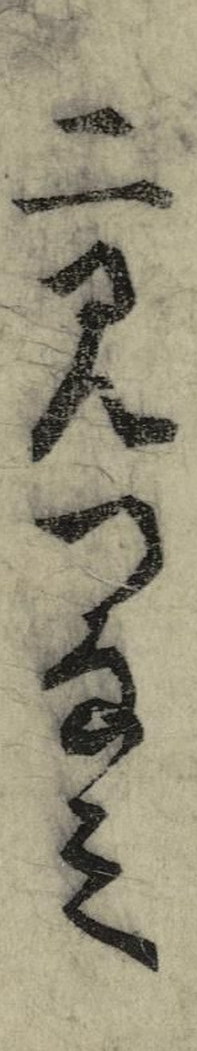二見つなミ
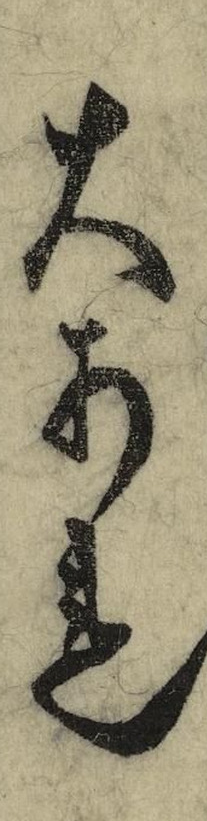大あれ
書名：諸國大地震つなみ混乱記　嘉永七寅十一月四日五日両日之次第三編
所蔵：東京大学地震研究所図書室 Earthquake Research Institute Library, The University of Tokyo, JAPAN
